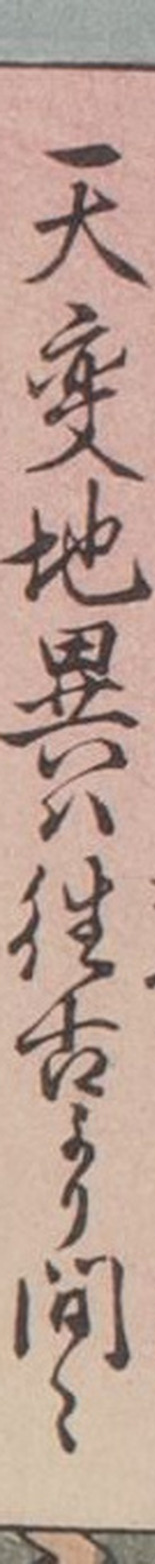天変地異は往古より間々
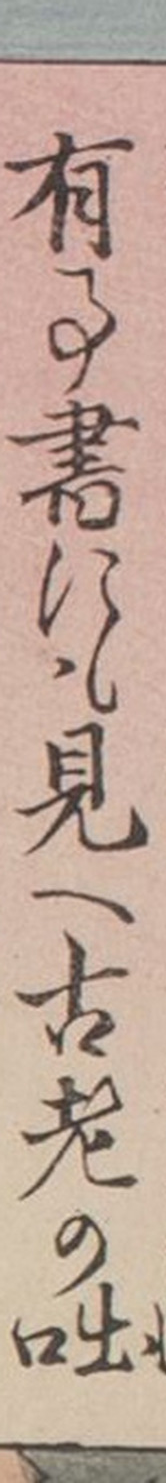有事書にも見へ古老の咄
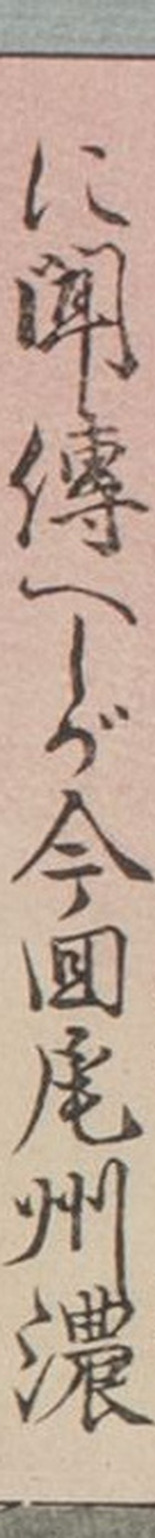に聞伝へしが今回尾州濃
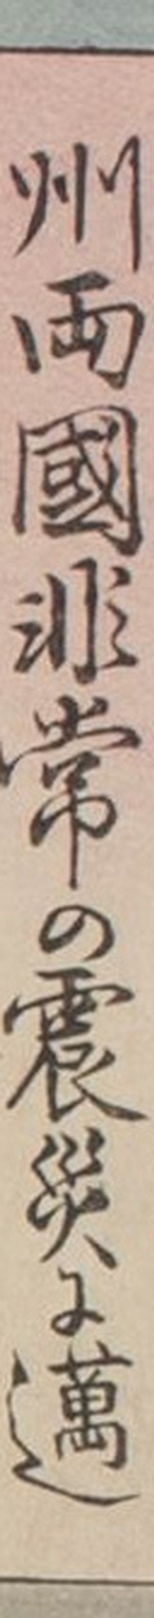州両国非常の震災に邁
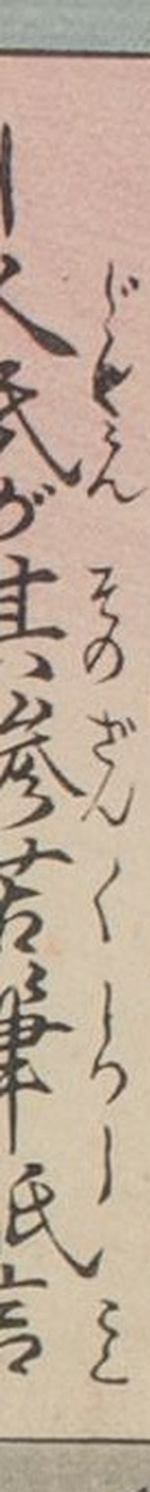し人民が其惨苦筆紙言
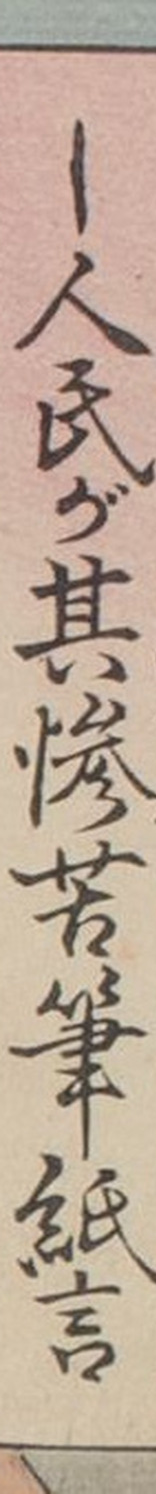し人民が其惨苦筆紙言
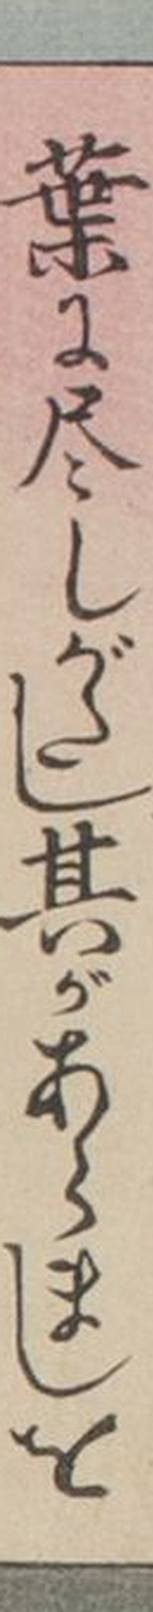葉に尽しがたし其があらましを
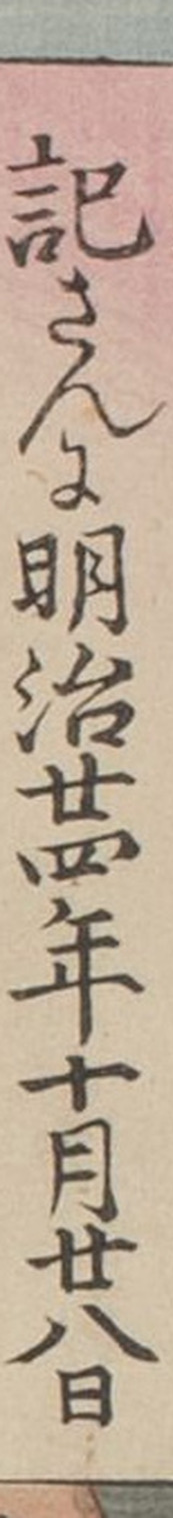記さんに明治廿四年十月廿八日
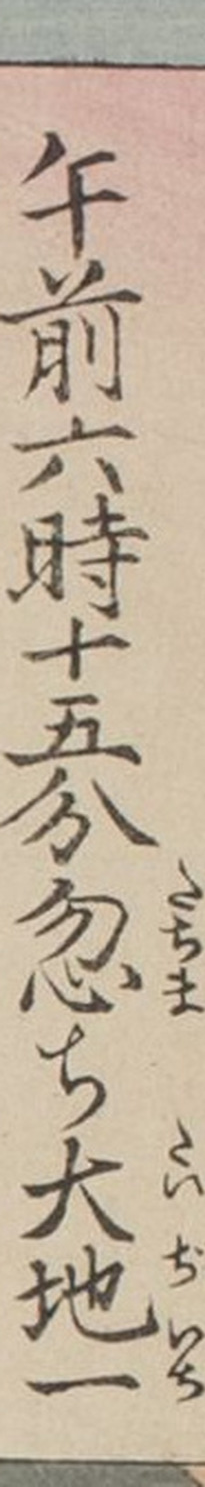午前六時十五分忽ち大地一
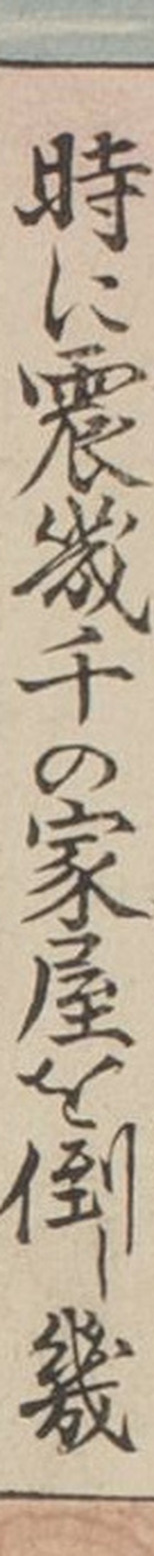時に震幾千の家屋を倒し幾
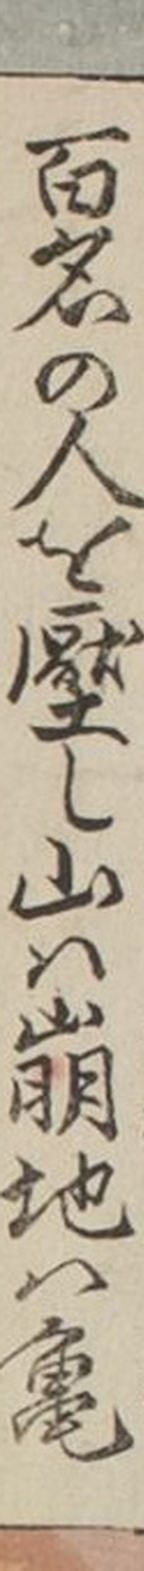百名の人を圧し山は崩地は亀
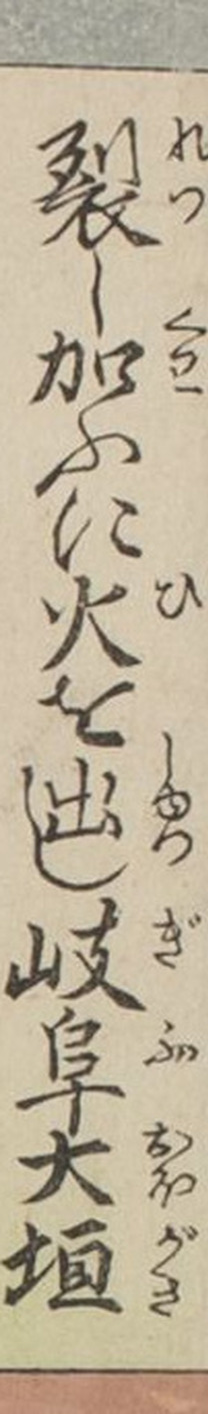裂し加ふに火を出し岐阜大垣
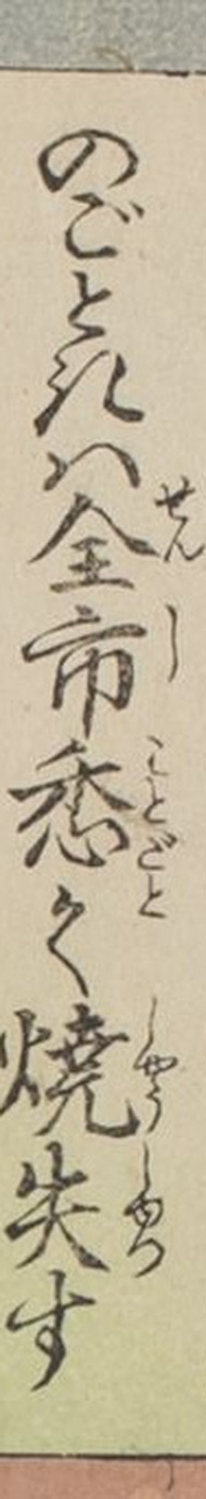のごときは全市悉く焼失す
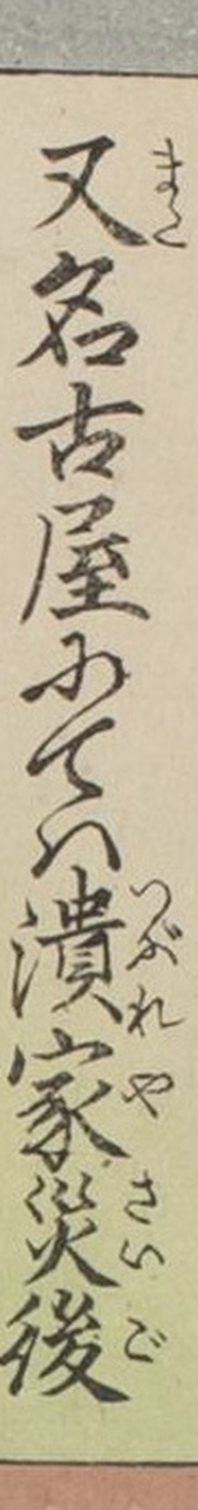又名古屋にては潰家災後
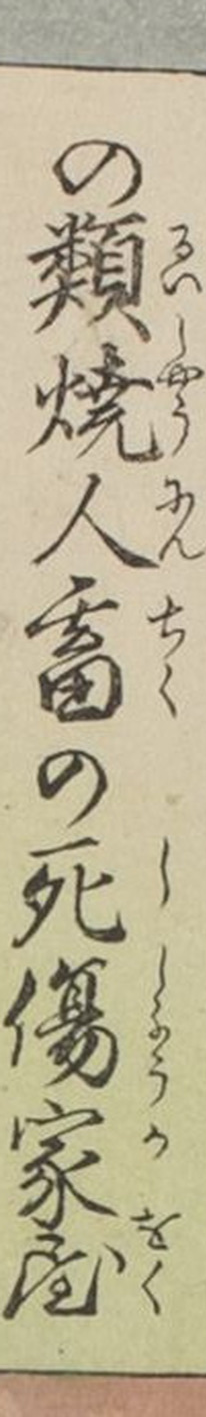の類焼人畜の死傷家屋
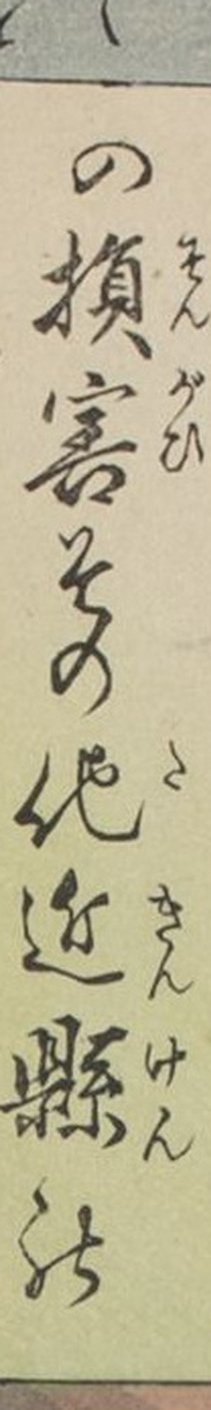の損害その他近県の
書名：岐阜県愛知県大地震実況
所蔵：あいおいニッセイ同和損保株式会社
